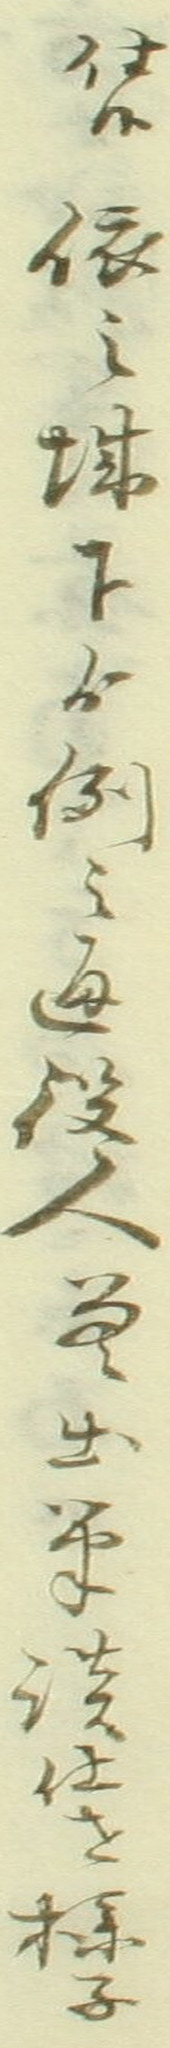仕候依之城下ゟ例之通役人差出筆談仕せ様子
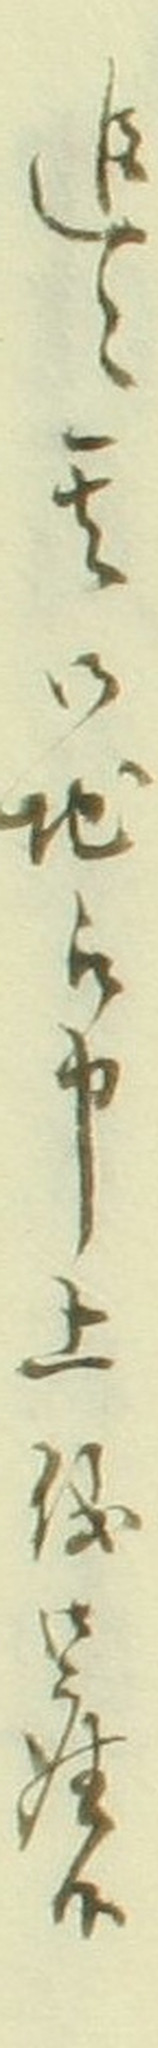追々其御地被申上儀御座候
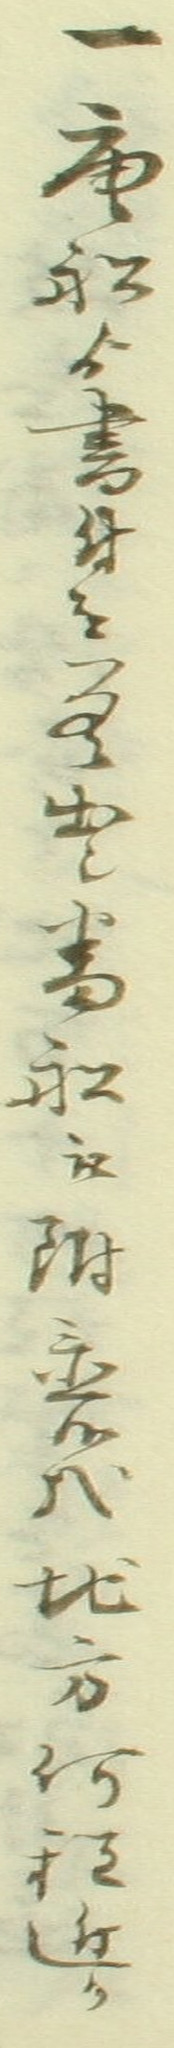一唐船ゟ書付を差出し番船被附置候哉地方何程近か
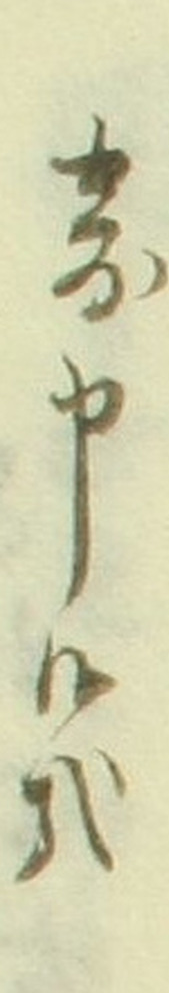寄申候哉
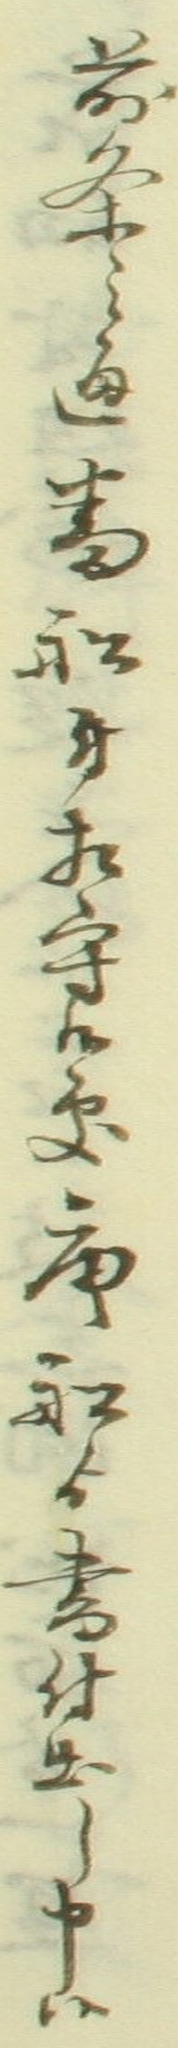前条之通番船付相守候処唐船ゟ書付出し申候

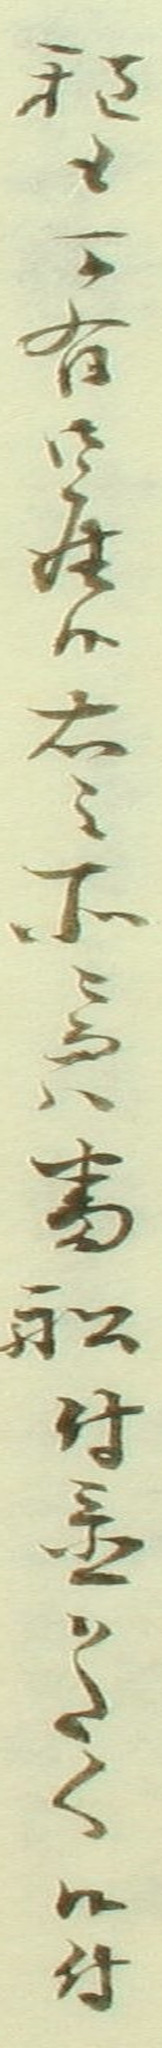程も可有御座候右之所に而は番船付置かたく候付
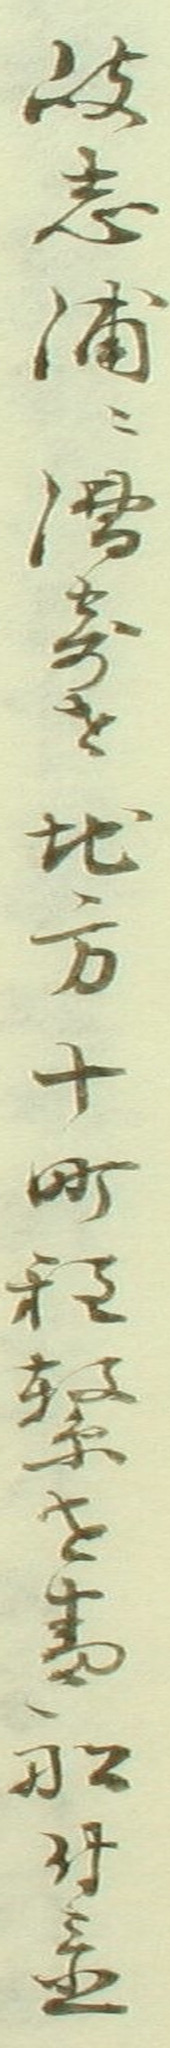岐志浦に漕寄せ地方十町程繋を番船付置
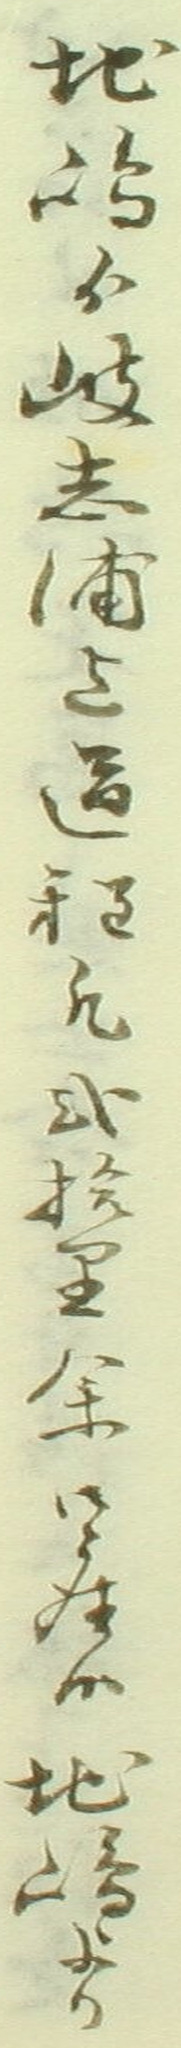地嶋ゟ岐志浦迄道程凡弐拾里余御座候地嶋より
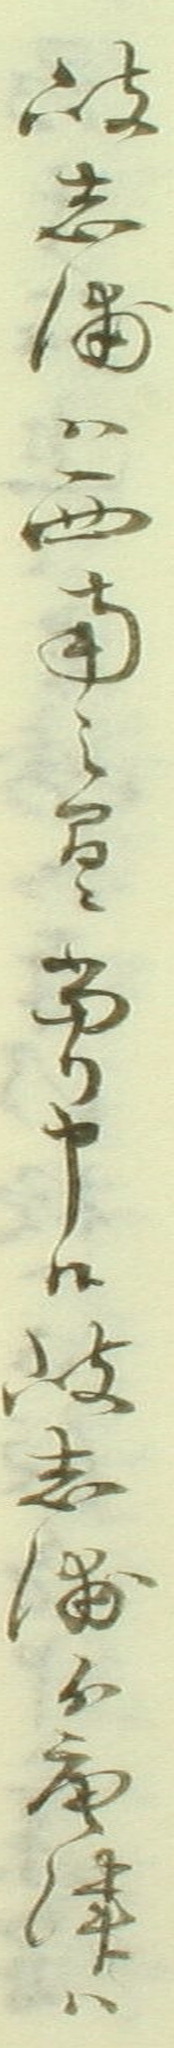岐志浦は西南之間に当り申候岐志浦ゟ唐津は
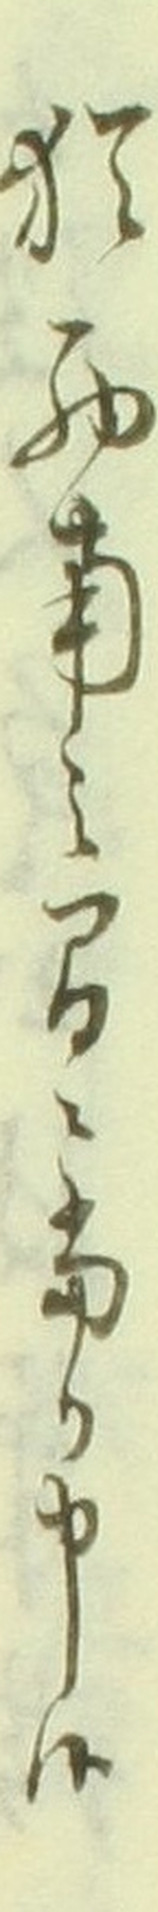猶西南之間に当り申候
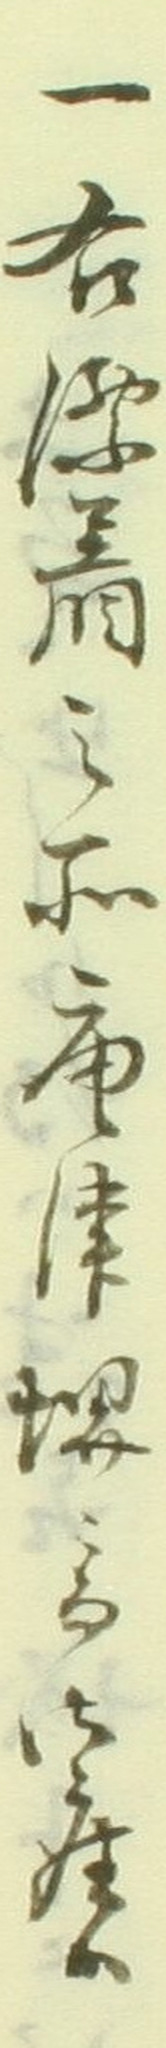一右漂着之所唐津堺に而御座候
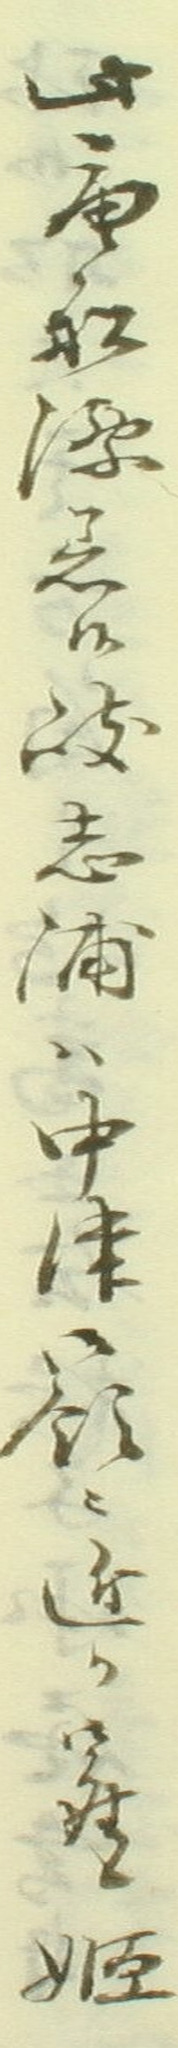此唐船漂着候岐志浦は中津御領に近く御座候姫
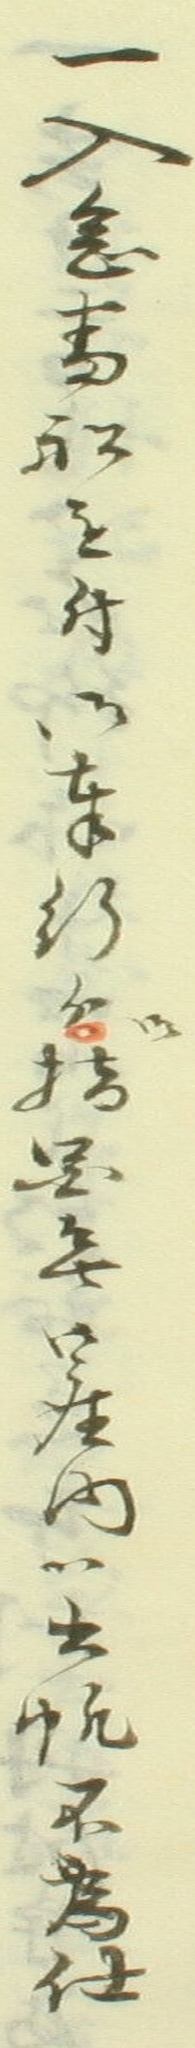一入念番船を付御奉行ゟ◦指図無御座内は出帆不為仕
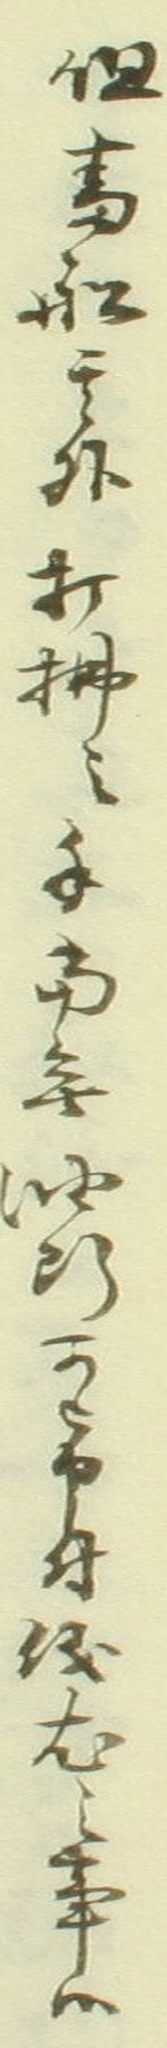但番船其外打払之手当無油断可被申付儀尤之事候
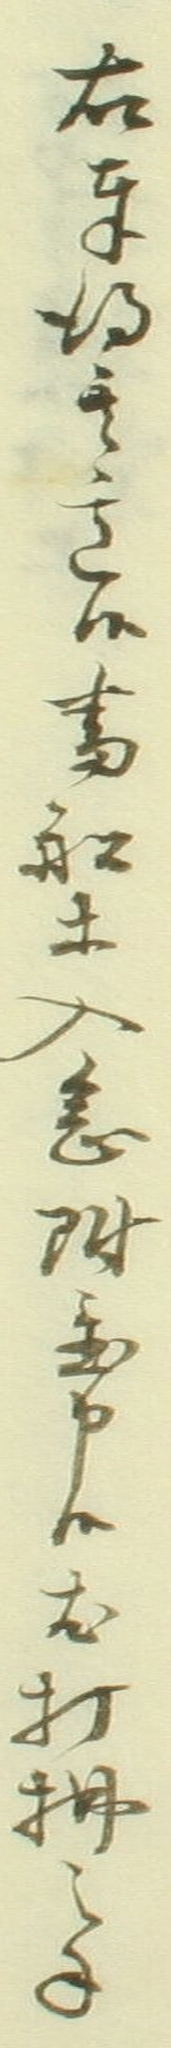右奉得其意候番船等入念附置申候尤打払之手
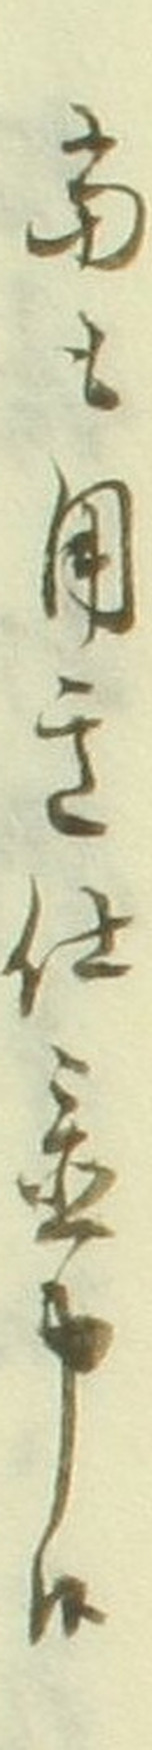当も用意仕置申候
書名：異国船漂着記
